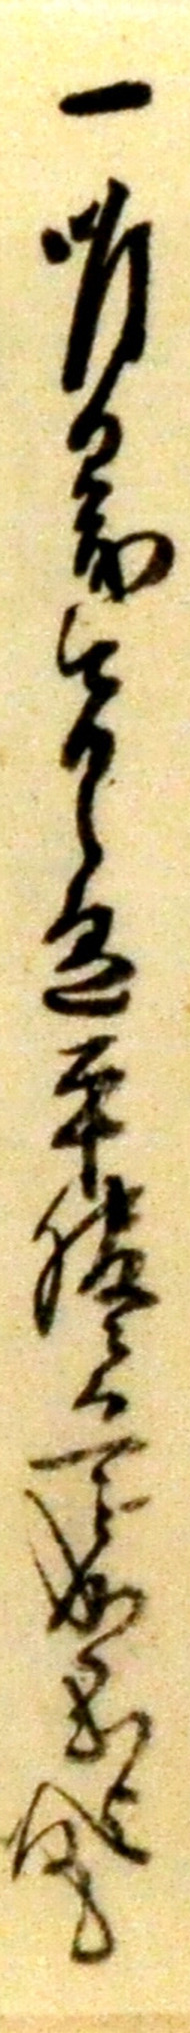一明日茂今日之通平服ニ而可被成御出与存候
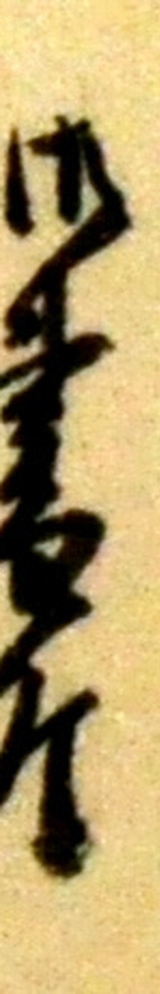御書付

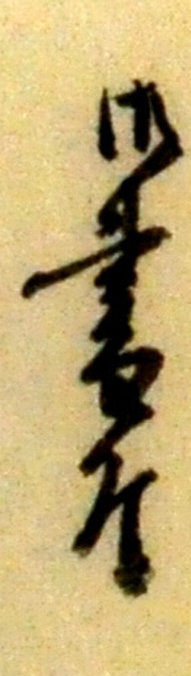御書付
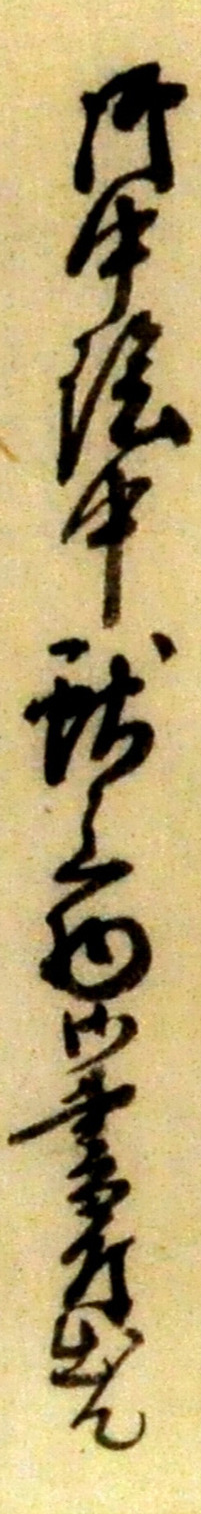御中陰中献上物御書付出候
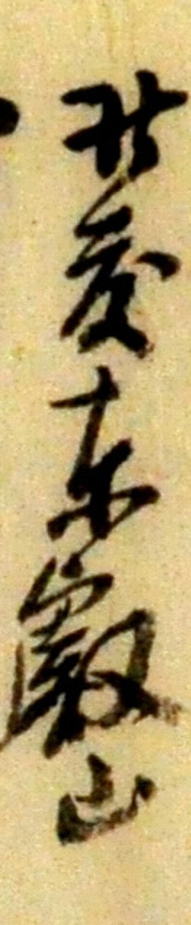此度東叡山
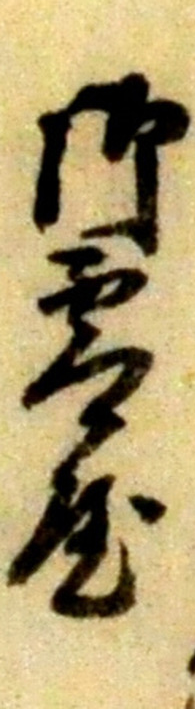御霊屋
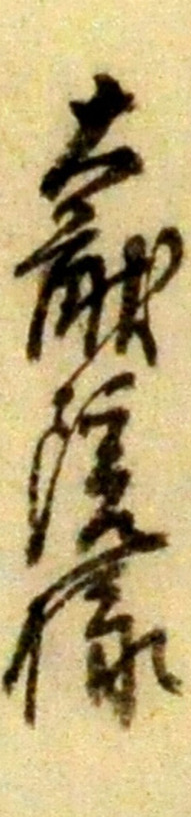大猷院様
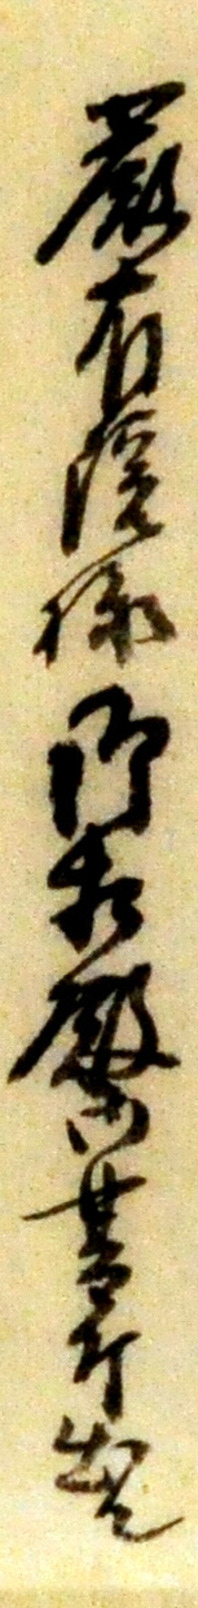厳有院様御相殿御書付出候
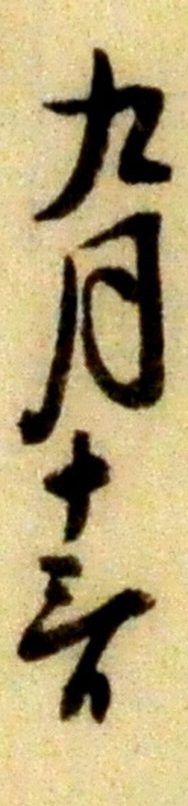九月十三日
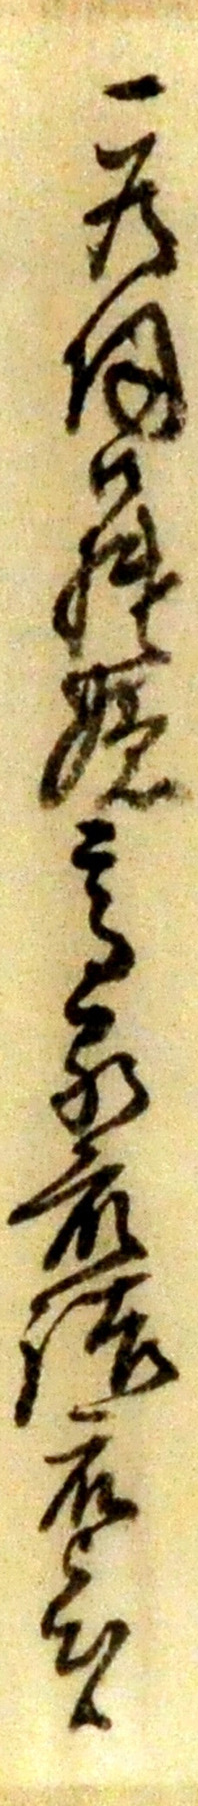一為伺御機嫌高家衆詰衆被出候
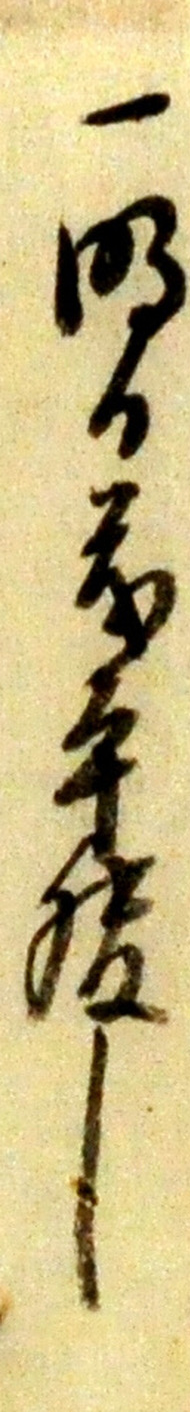一明日茂平服ーー
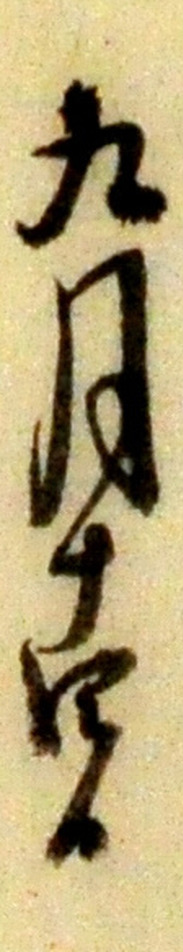九月十四日
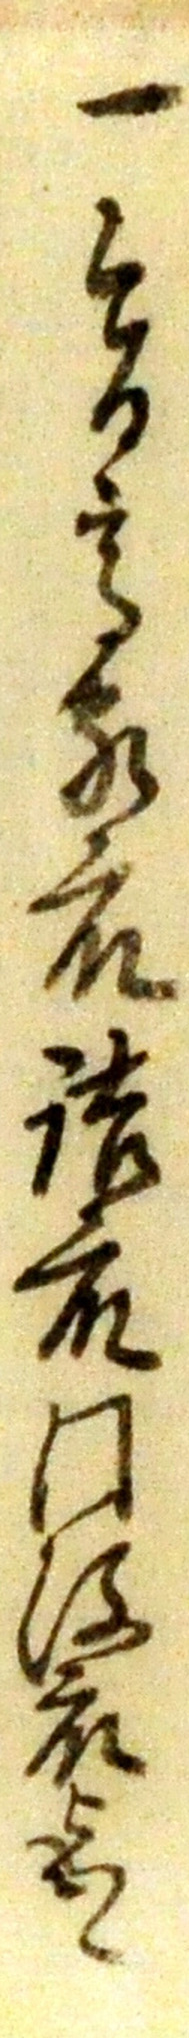一今日高家衆詰衆同役衆被出候
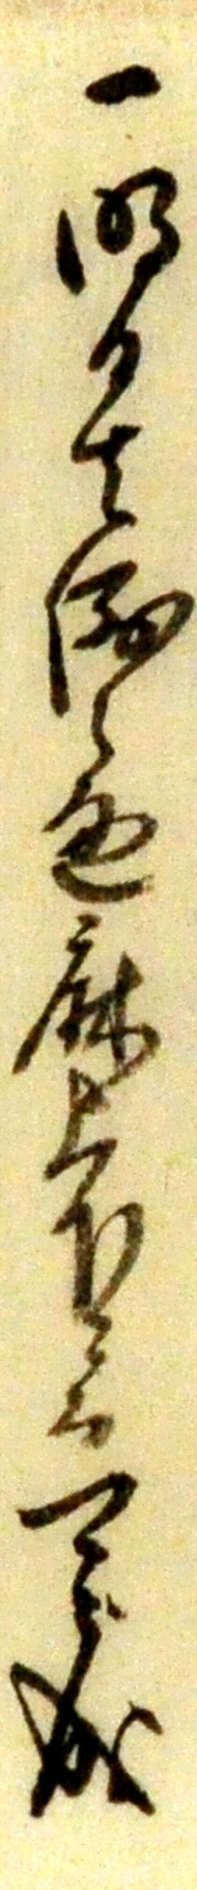一明日者例之通麻上下ニ而可被成
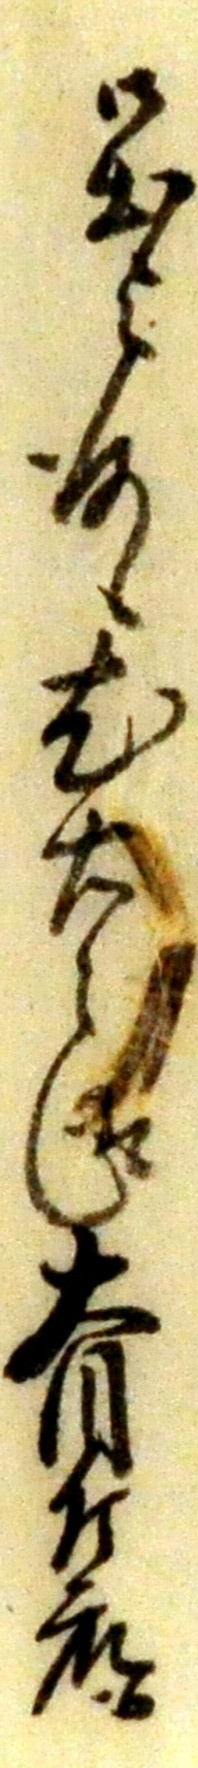御出与存候尤右之趣大目付衆江
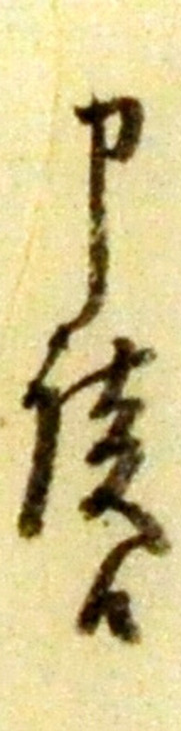申談候
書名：書抜
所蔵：伊那市立高遠町図書館・合同会社AMANE
